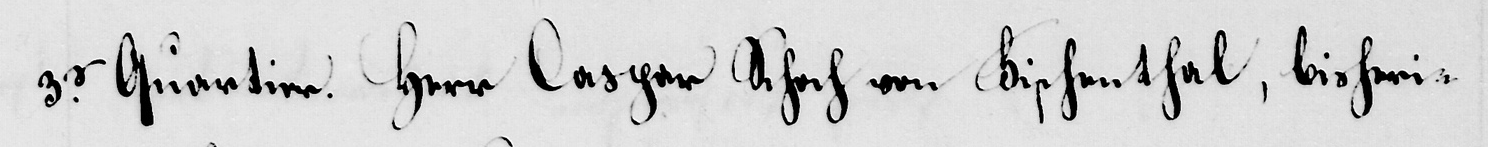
3s. Quartier. Herr Caspar Schoch von Fischenthal, bisheri¬
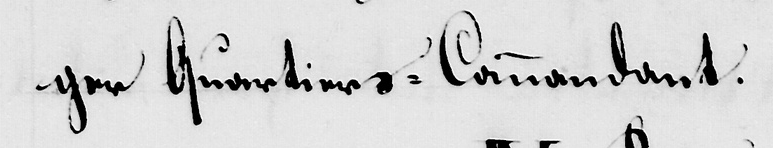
ger Quartiers-Commandant.
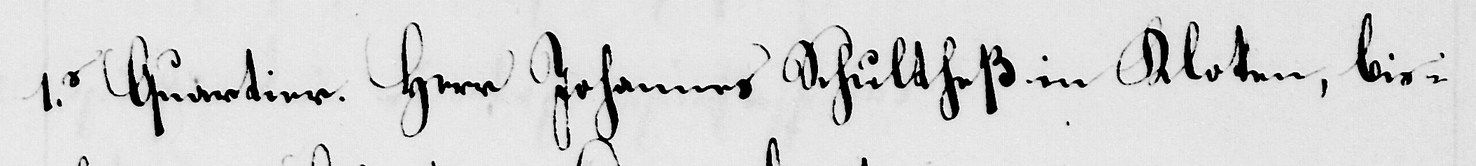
1s. Quartier. Herr Johannes Schultheß in Kloten, bis¬
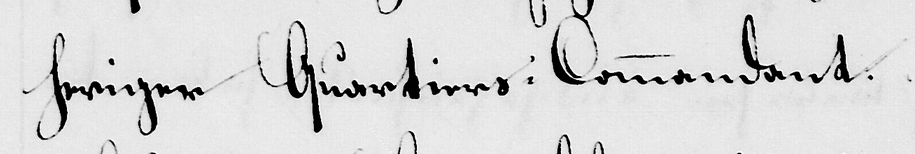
heriger Quartiers-Commandant.
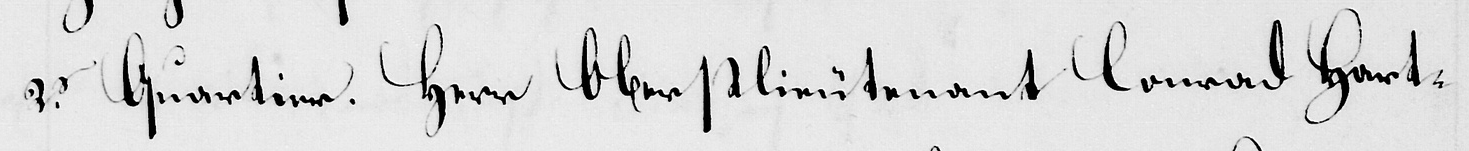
2s. Quartier. Herr Oberstlieutenant Conrad Hart¬
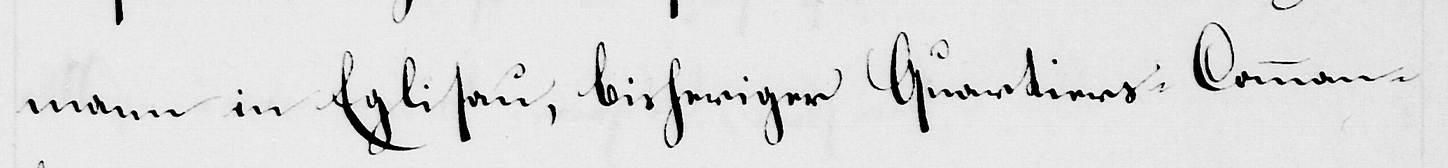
mann in Eglisau, bisheriger Quartiers-Comman¬
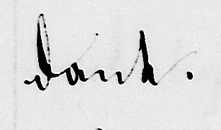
dant.
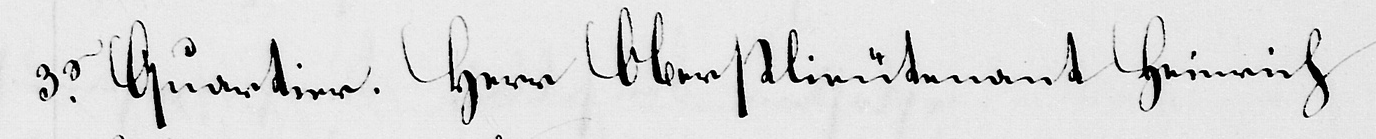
3s. Quartier. Herr Oberstlieutenant Heinrich
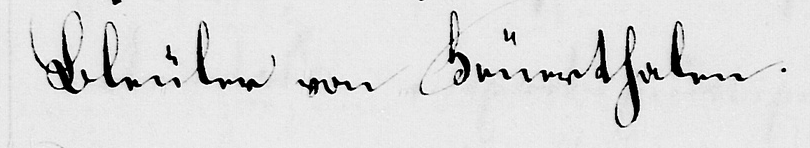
Bleuler von Feuerthalen.
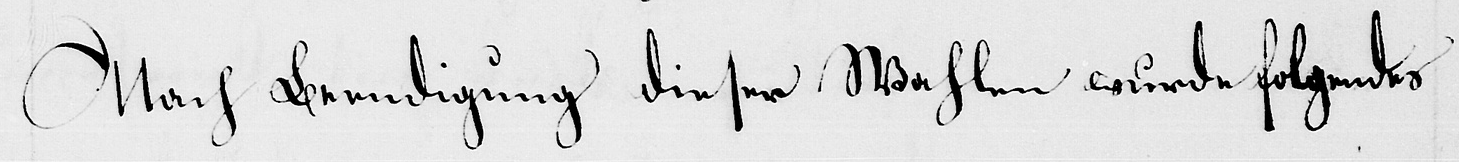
Nach Beendigung dieser Wahlen wurde folgendes
